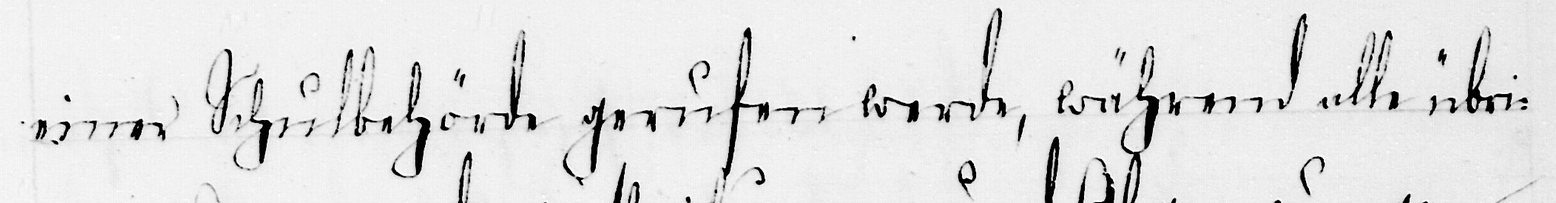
einer Schulbehörde gerufen werde, während alle übri¬
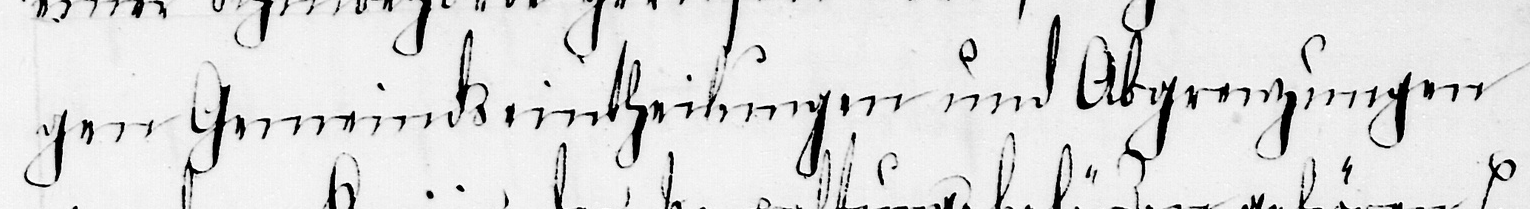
gen Gemeindseintheilungen und Abgrenzungen
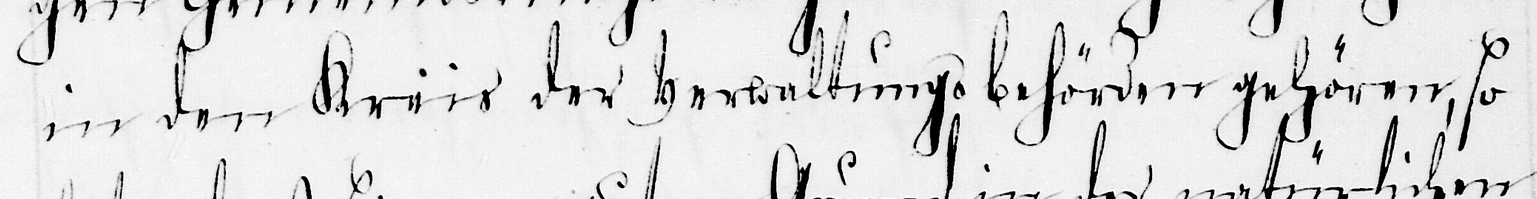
in den Kreis der Verwaltungsbehörden gehören, so
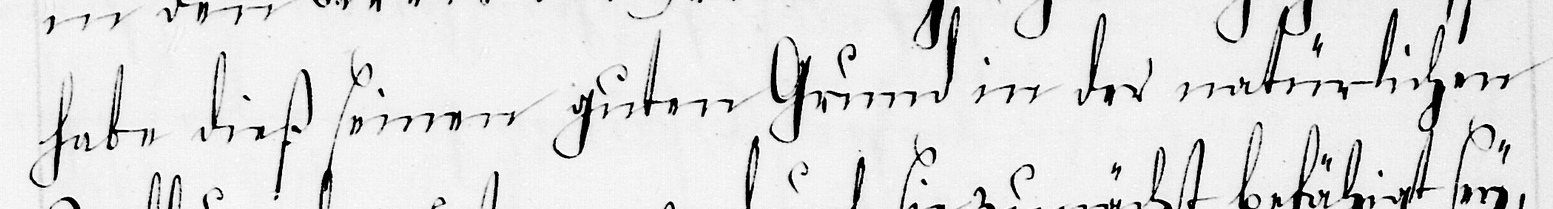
habe dieß seinen guten Grund in der natürlichen
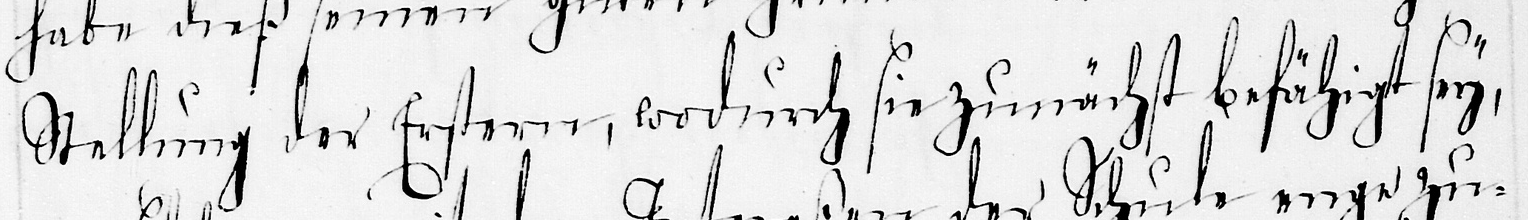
Stellung der Erstern, wodurch sie zunächst befähigt sey,
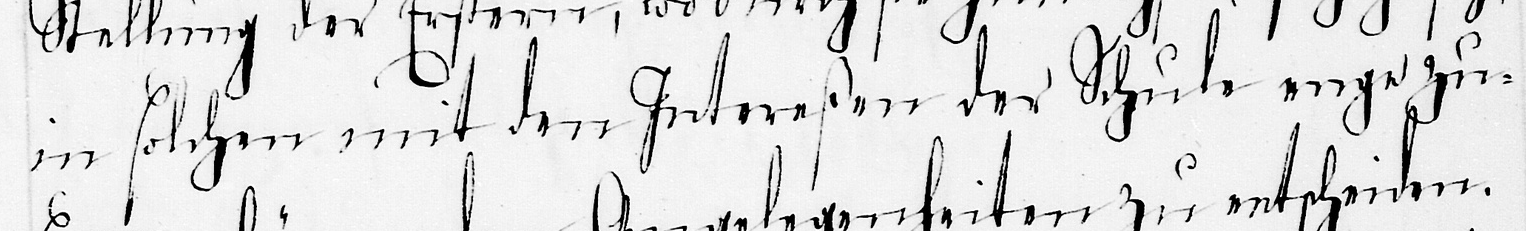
in solchen mit den Intereßen der Schule enge zu¬
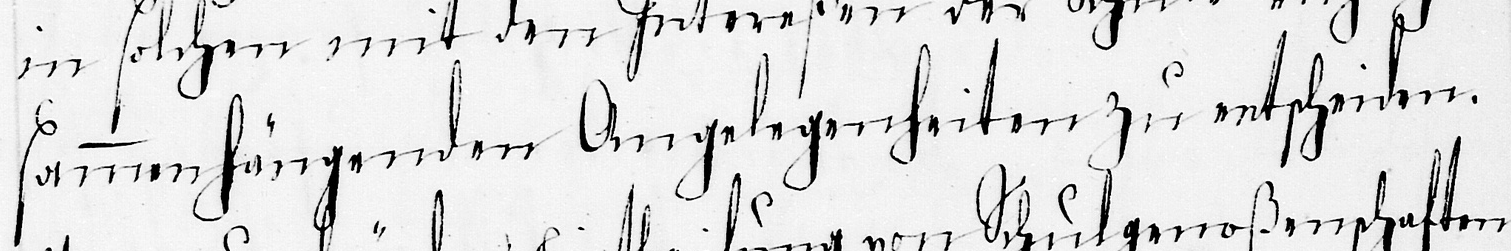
sammenhängenden Angelegenheiten zu entscheiden.
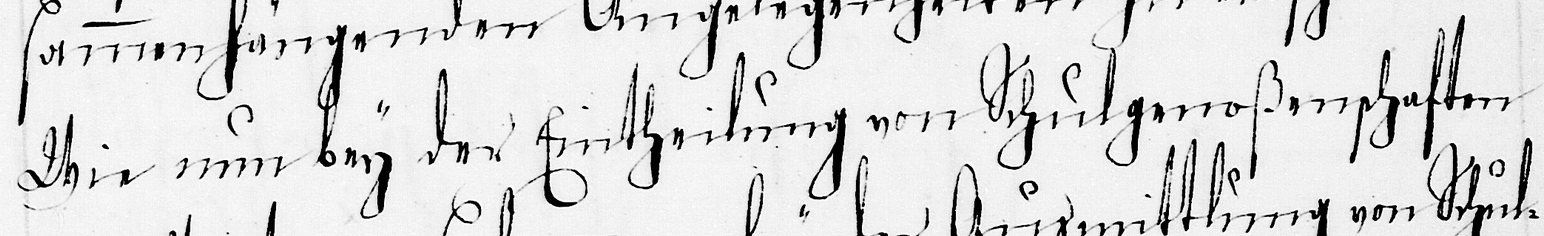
Wie nun bey der Eintheilung von Schulgenoßenschaften
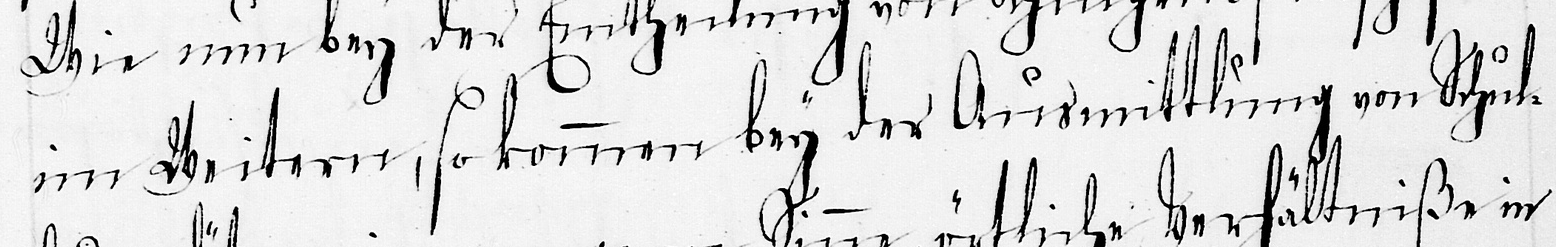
im Weitern, so kommen bey der Ausmittlung von Schu¬
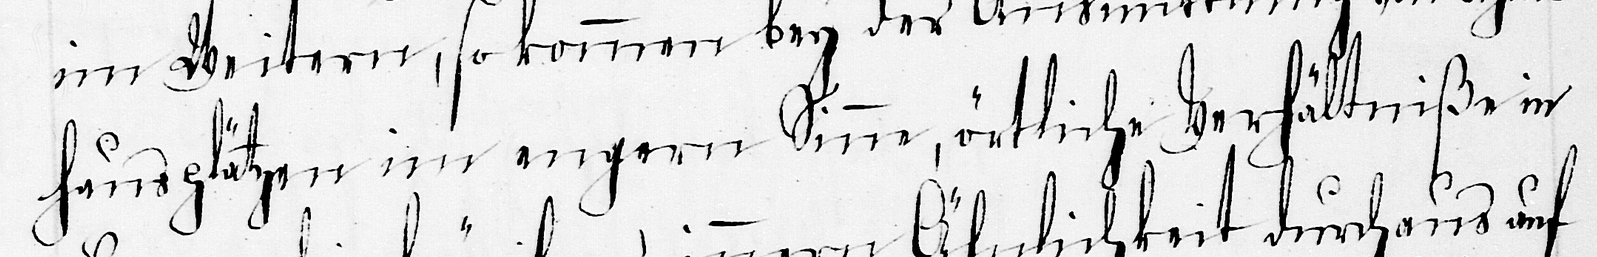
lhausplätzen im engern Sinne, örtliche Verhältniße in
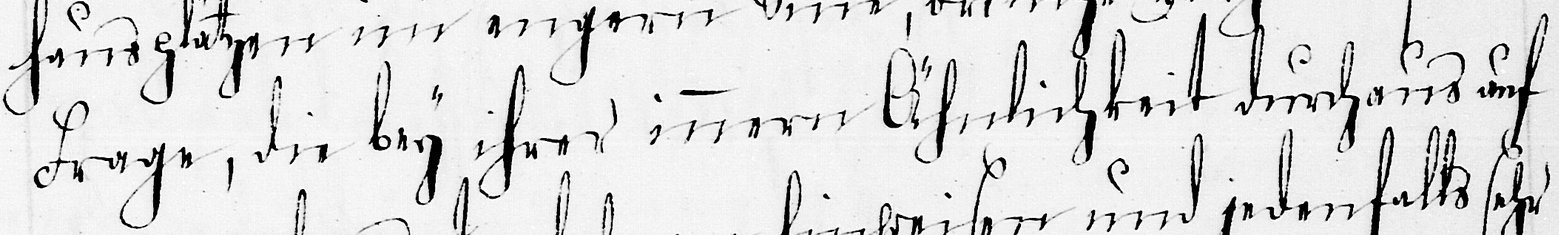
Frage, die bey ihrer innern Ähnlichkeit durchaus auf
